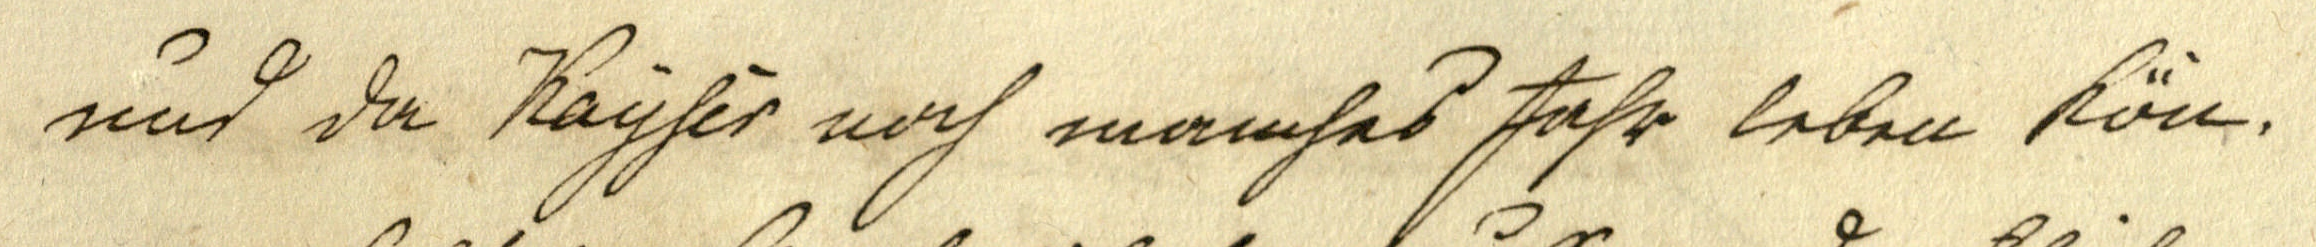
und da Kayer noch manches Jahr leben kön-
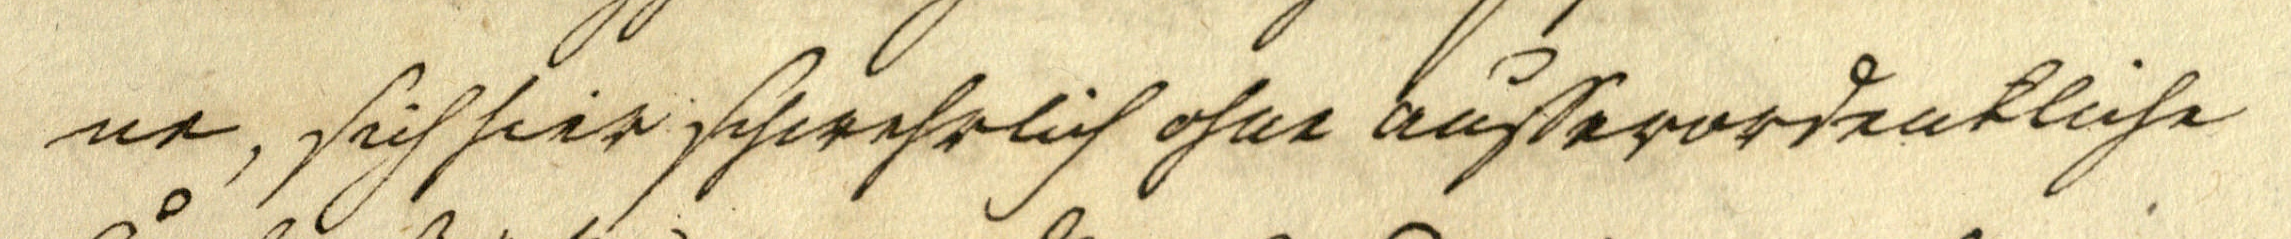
ne, sich hier schwehrlich ohne ausserordentliche
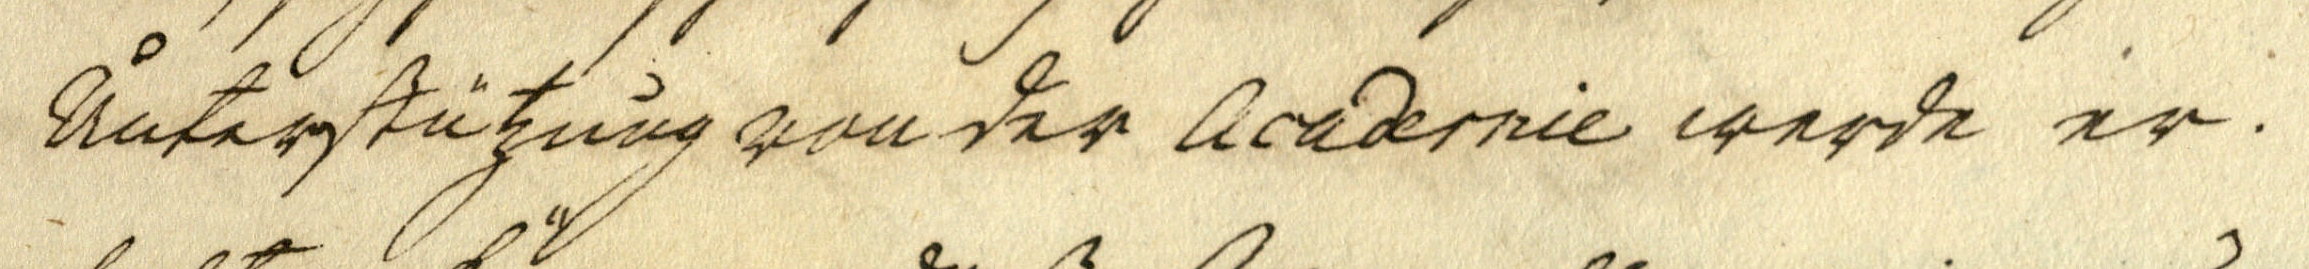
Unterstützung von der Academie werden er-
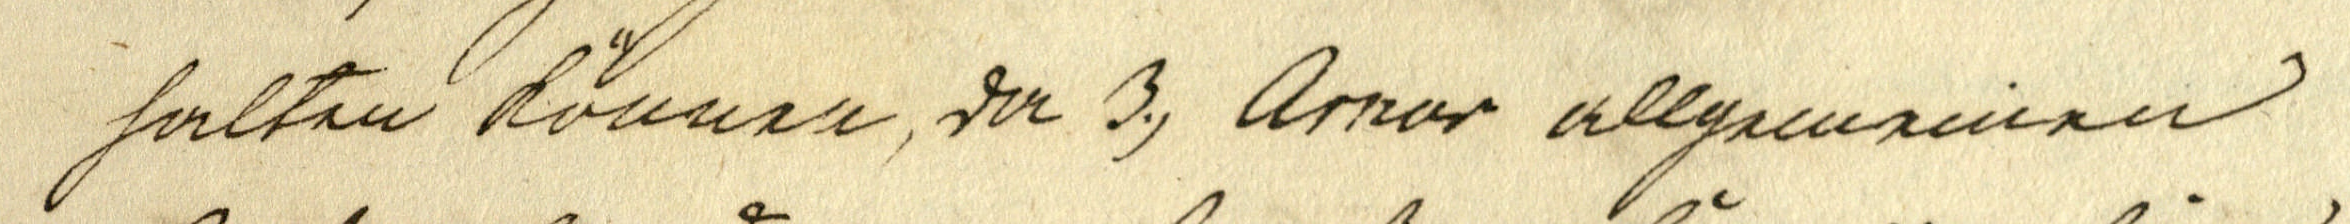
halten können, da 3., Amor allgemeinen
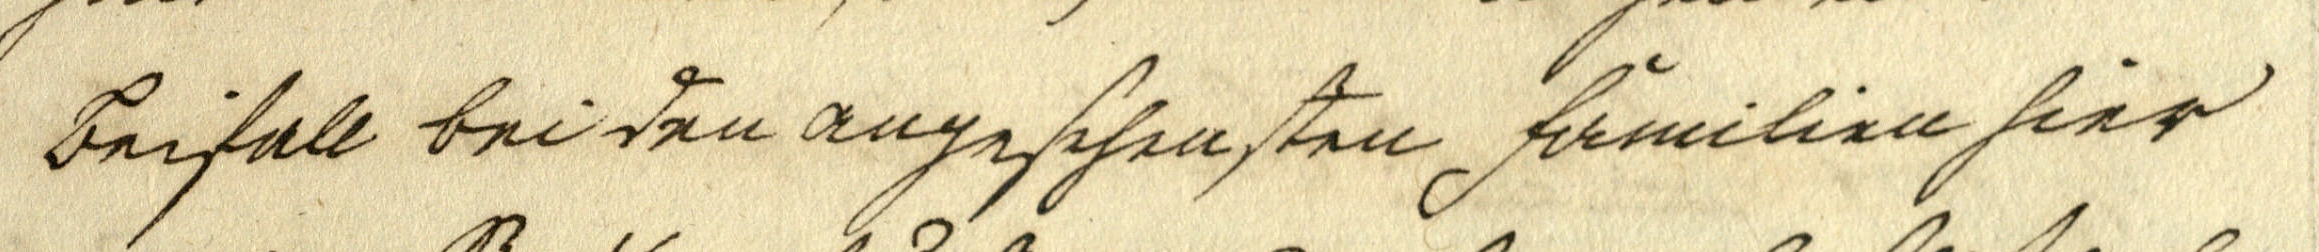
Beifall bei den angesehensten Familien hier
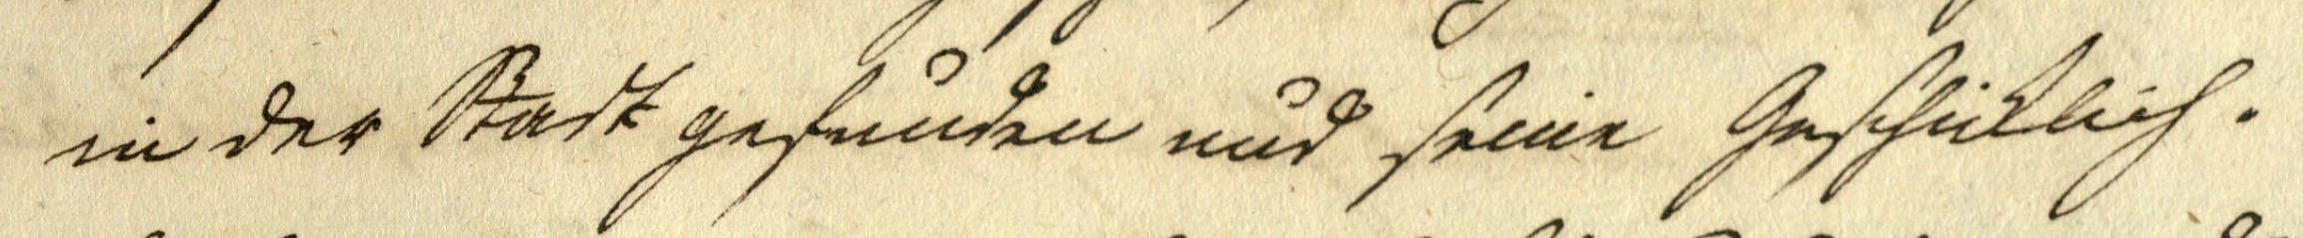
in der Stadt gefunden und seine Geschicklich-
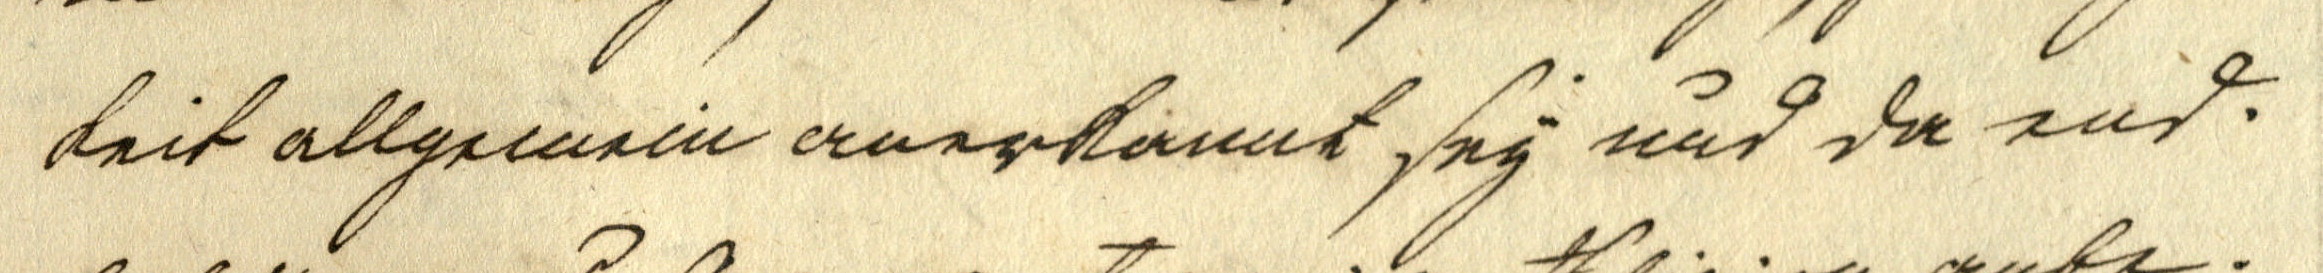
keit allgemein anerkannt sey und da end-
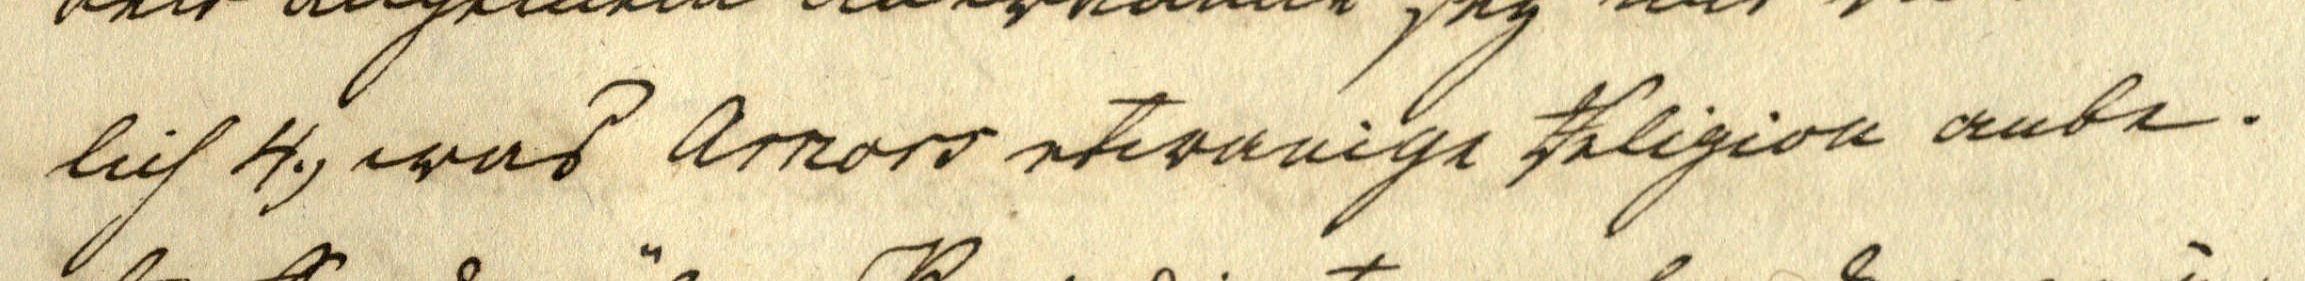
lich 4., was Amors etwanige Religion anbe-
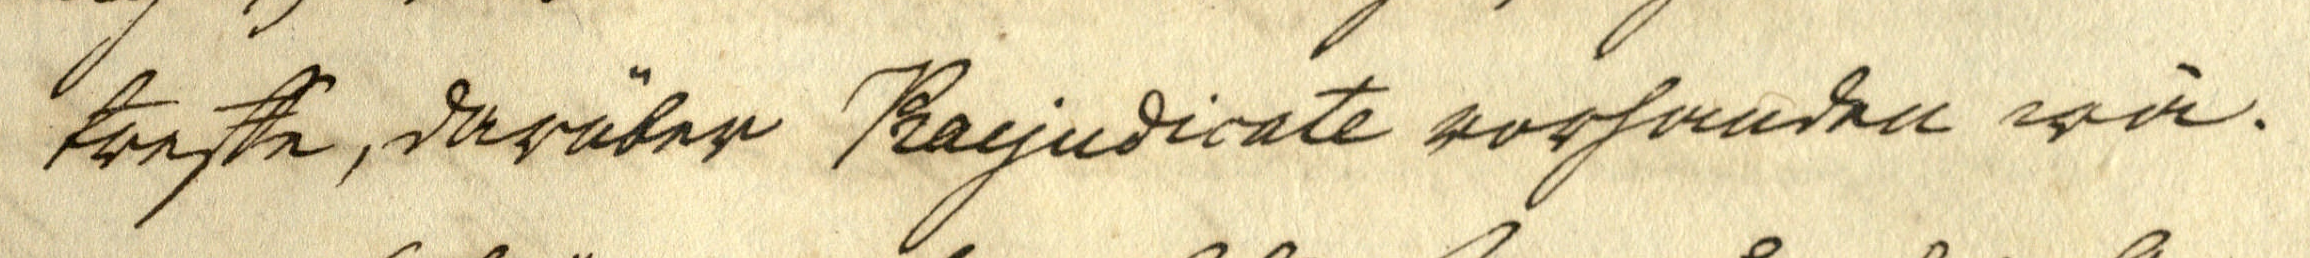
treffe, darüber Praejudicate vohanden wä-
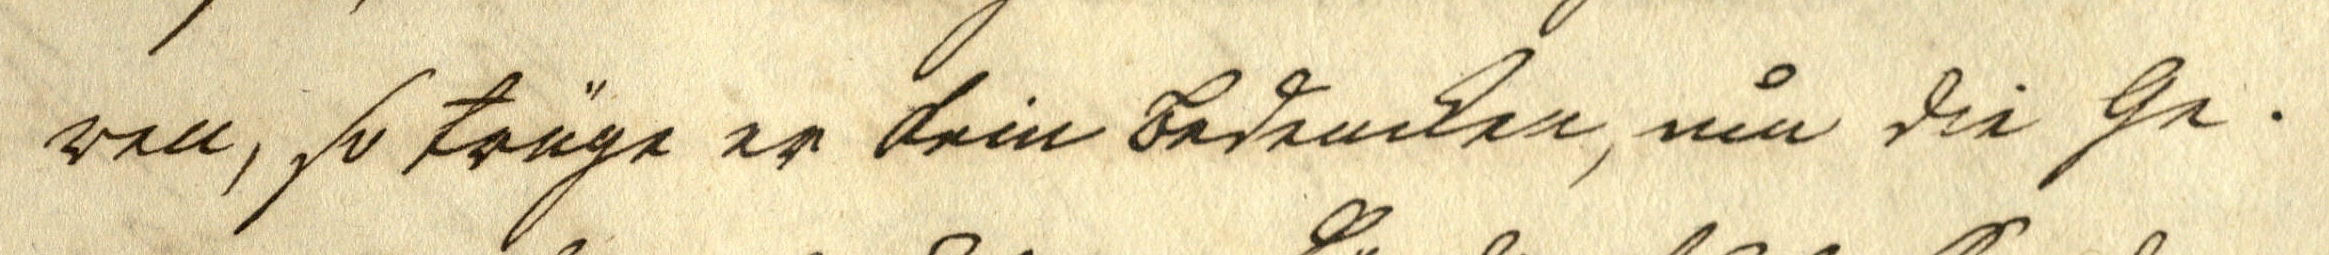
ren, so trüge er kein Bedenken, um die Ge-
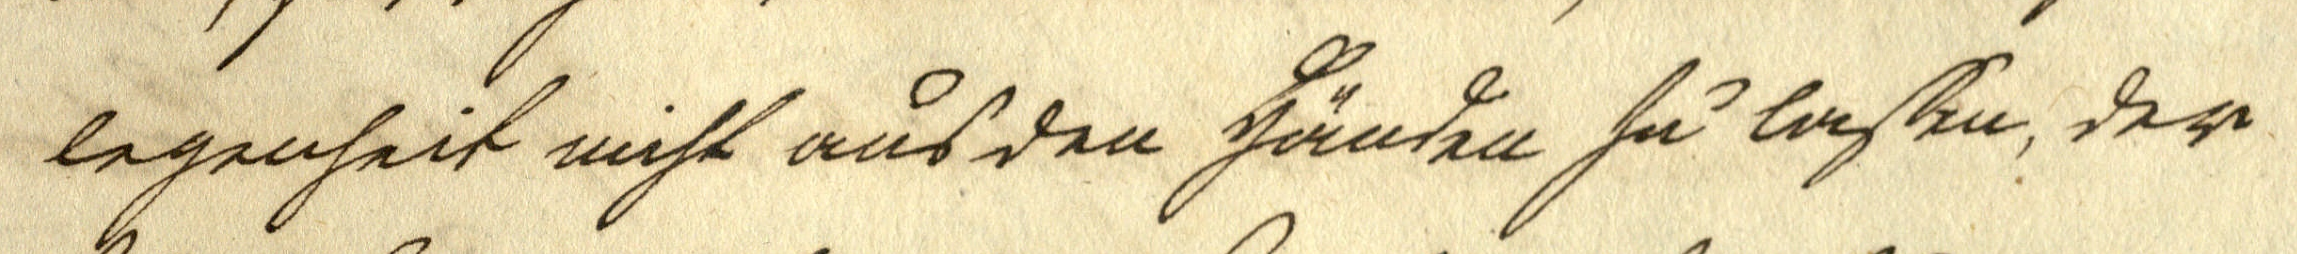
legeneheit nicht aus den Händen zu lassen, der
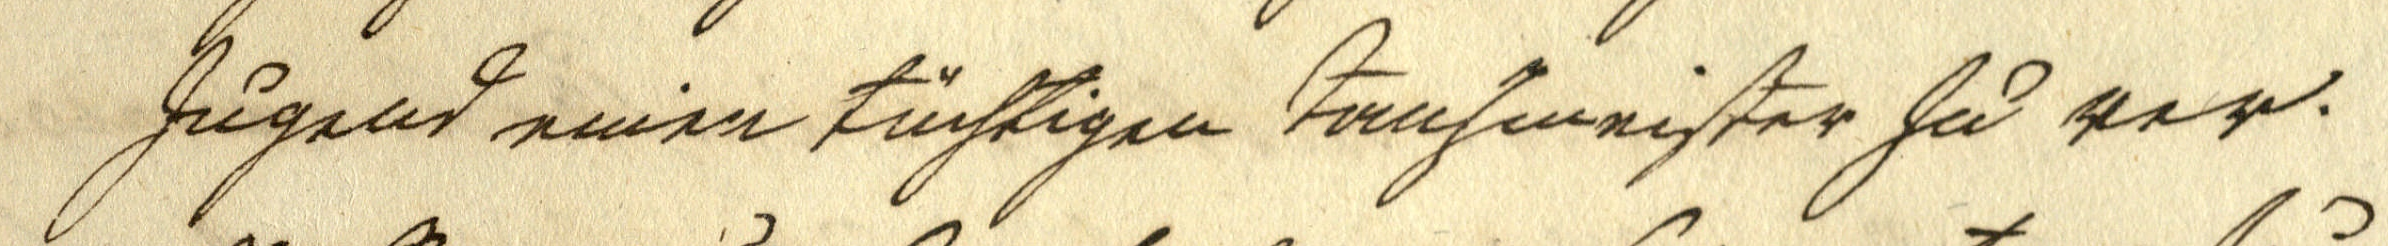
Jugend einen tüchtigne Tanzmeister zu ver-
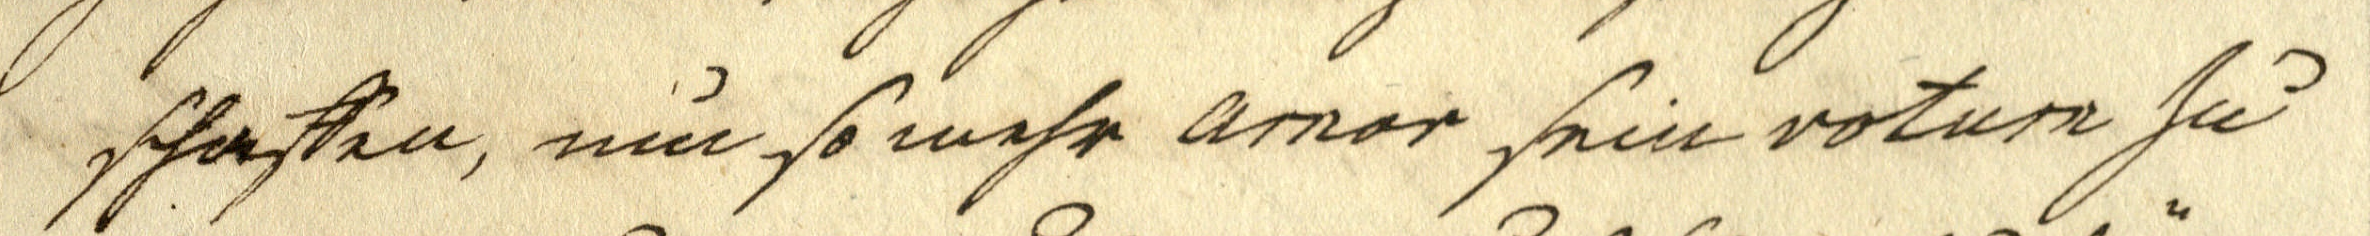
schaffen, um so mehr Amor sein votum zu
